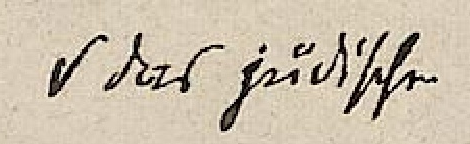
V das jüdische
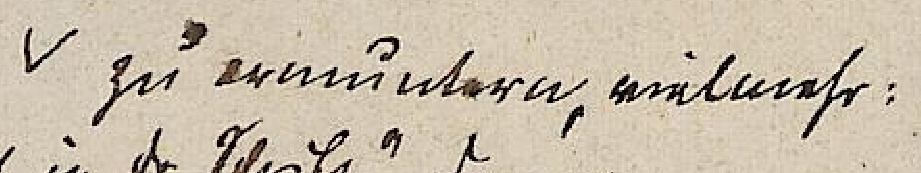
V zu ermuntern vielmehr:
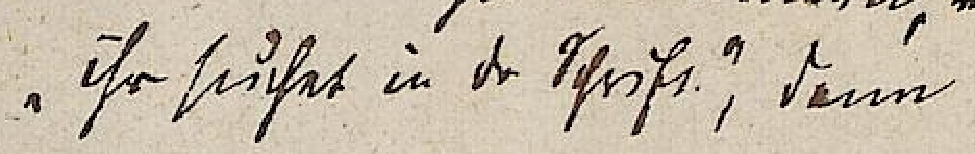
"ihr suchet in dr. Schrift", denn
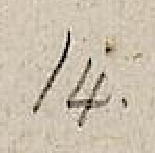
14.
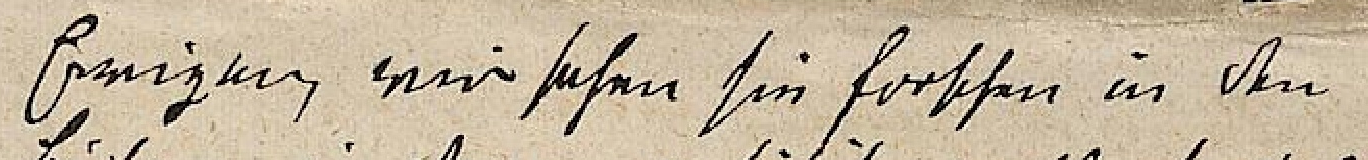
Ewigen, wir sehen sie forschen in den
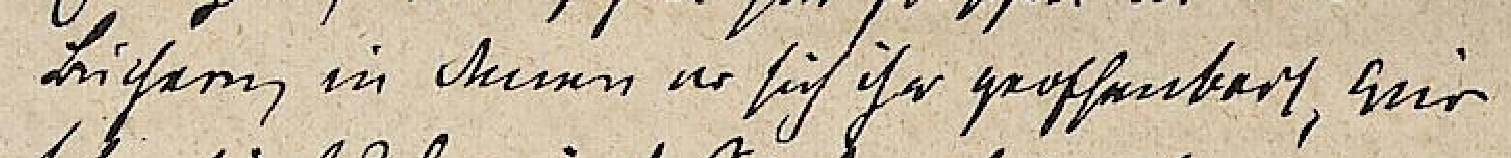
Büchern, in denen er sich ihr geoffenbart, wir
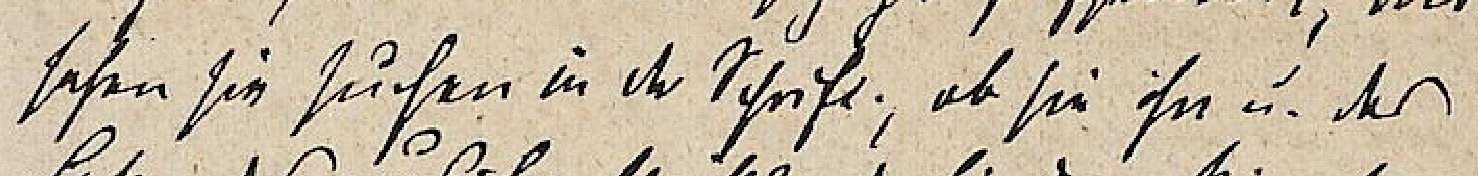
sehen sie suchen in der Schrift, ob sie ihn u. das
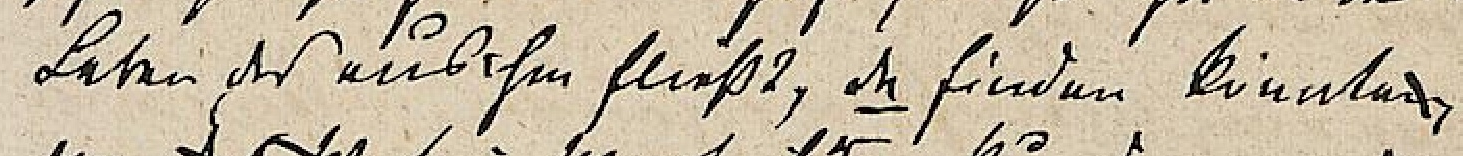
Leben, das aus ihm fließt, da finden könnten,
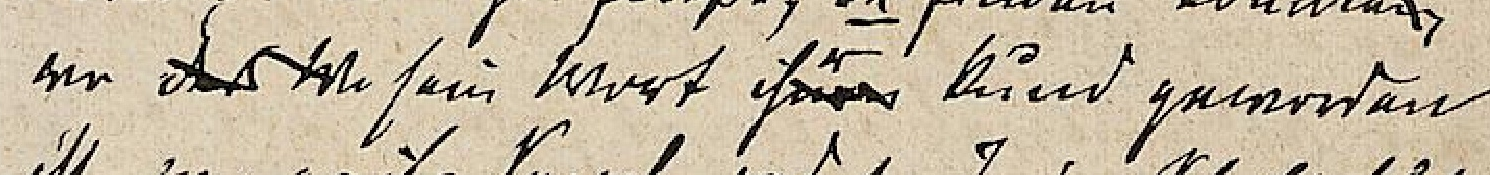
wo das W sein Wort ihnen kund geworden
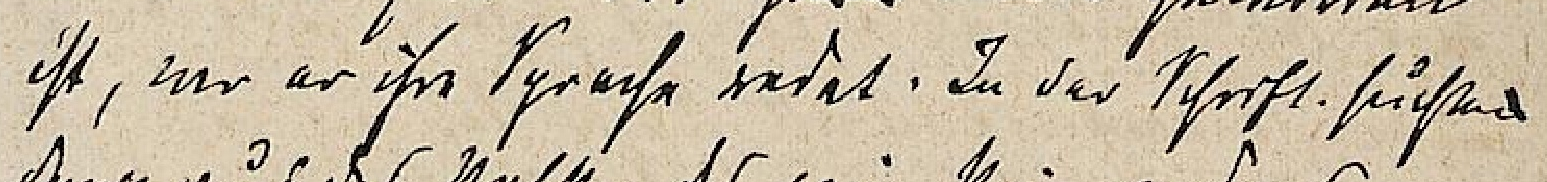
ist, wo er ihre Sprache redet. In der Schrift. suchten
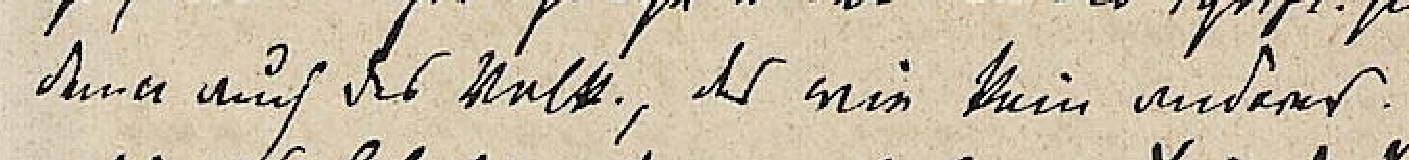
denn auch des Volk., ds wie kein anderes
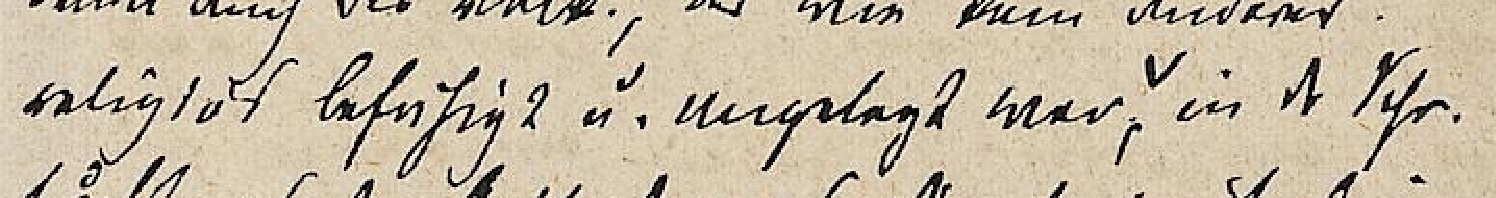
religiös befähigt u. angelegt war, in dr Schr.
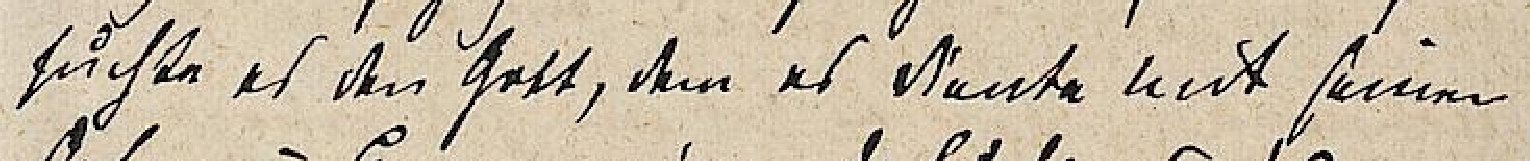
suchte es den Gott, dem es diente mit seinen
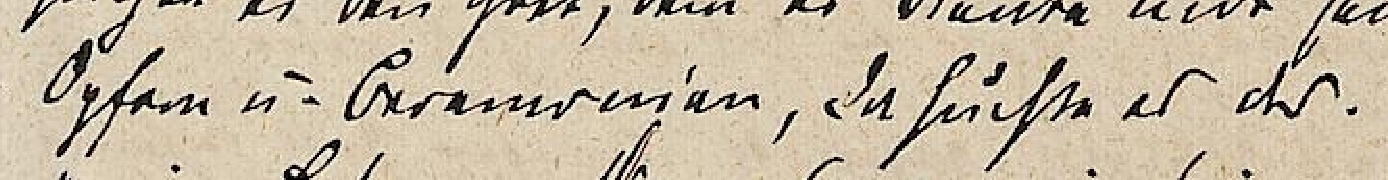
Opfern u. Ceremonien, da suchte es ds.
